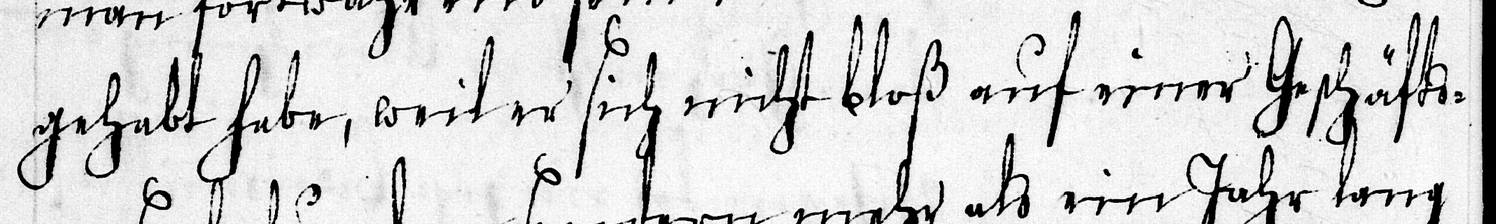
gehabt habe, weil er sich nicht bloß auf einer Geschäfts¬
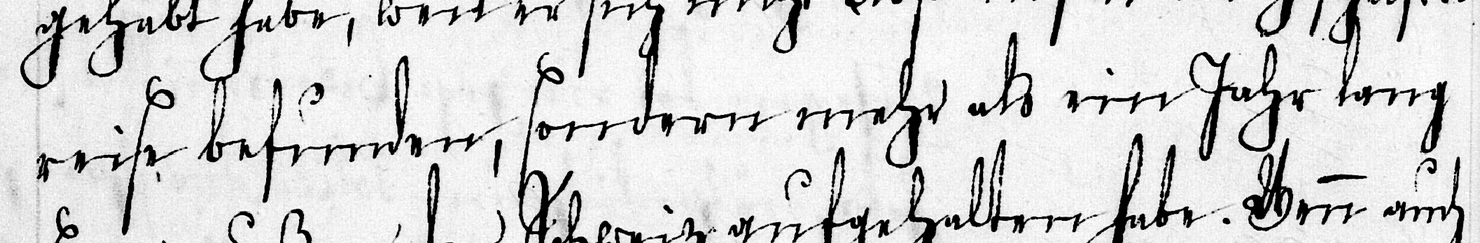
reise befunden, sondern mehr als ein Jahr lang
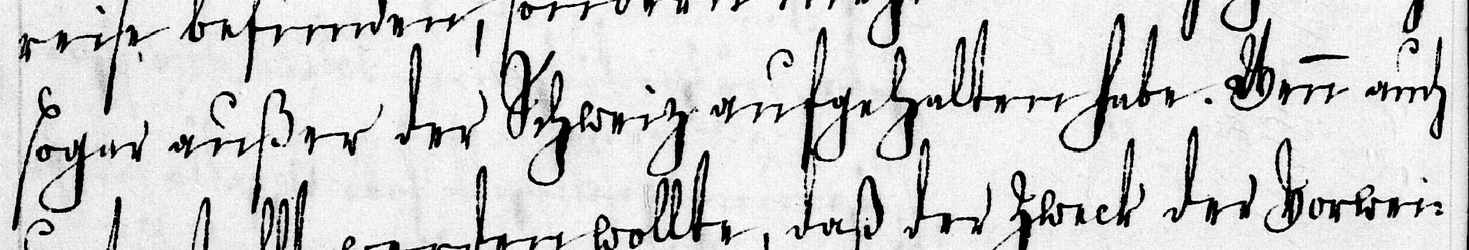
sogar außer der Schweiz aufgehalten habe. Wenn auch
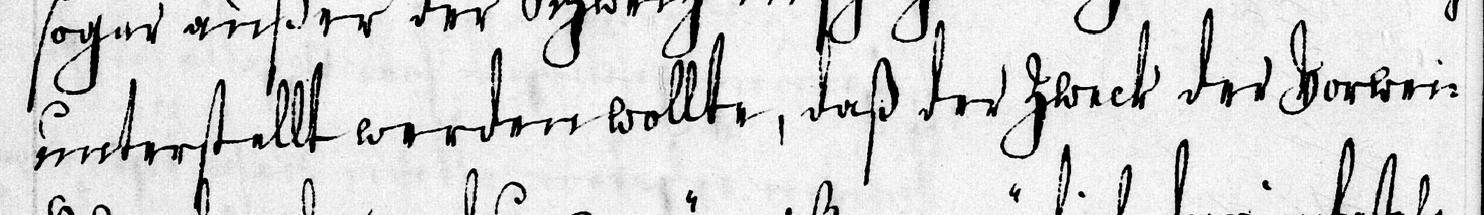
unterstellt werden wollte, daß der Zweck der Vorwei¬
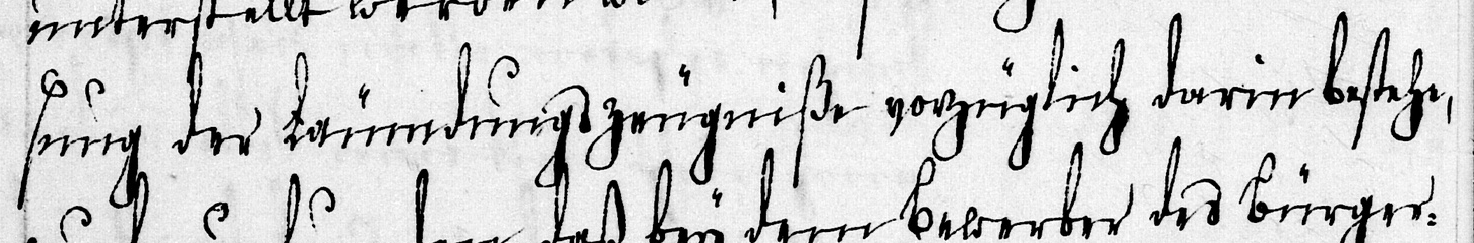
sung der Leumdungszeugniße vorzüglich darin besteh¬
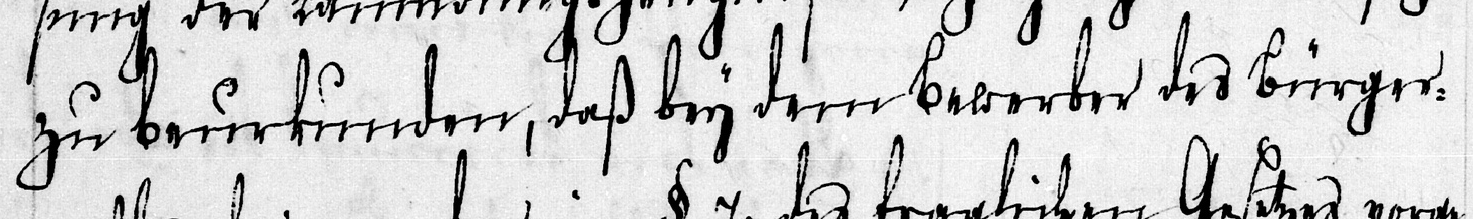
zu beurkunden, daß bey dem Bewerber des Bürger¬
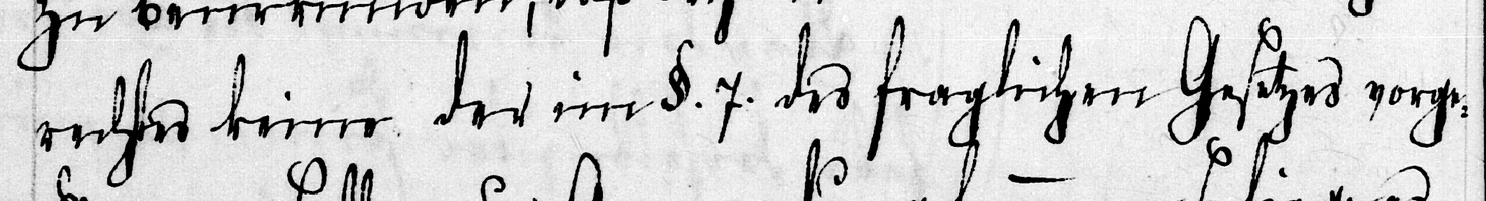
rechtes keine der im §. 7. des fraglichen Gesetzes vorge¬
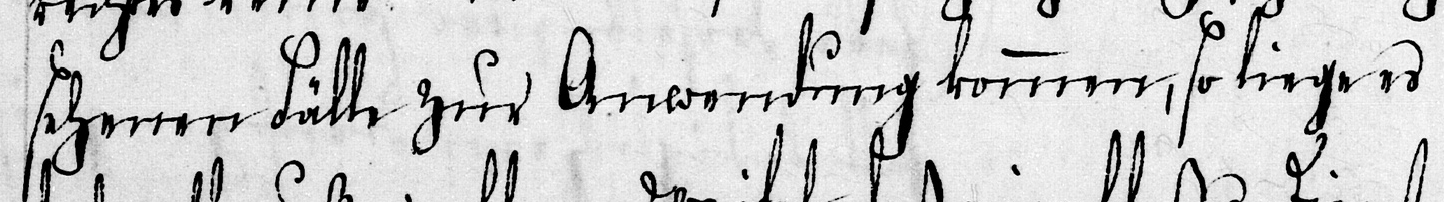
sehenen Fälle zur Anwendung kommen, so liege es
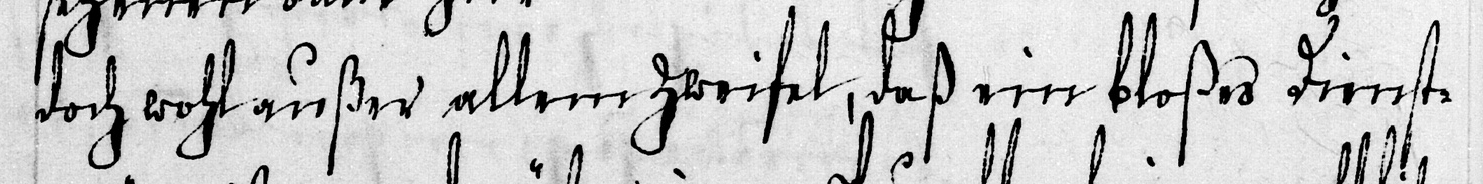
doch wohl außer allem Zweifel, daß ein bloßes Dienst¬
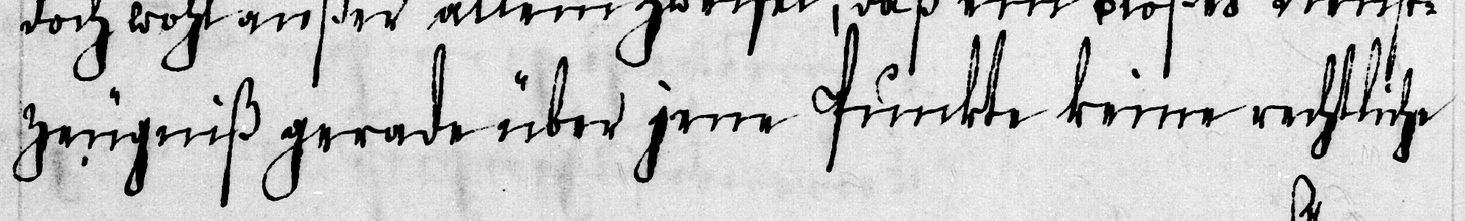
zeugniß gerade über jene Punkte keine rechtlic¬
